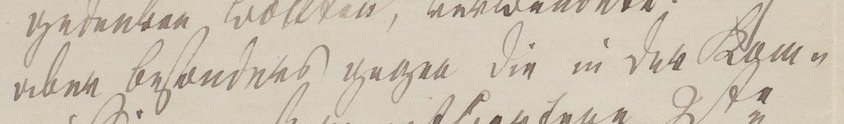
aber besonders gegen die in der Kom-
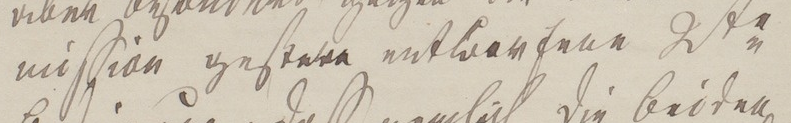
mission gestern entworfene 2te
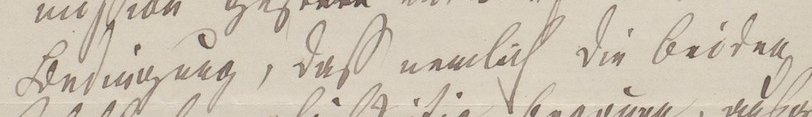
Bedingung, dass nemlich die beiden
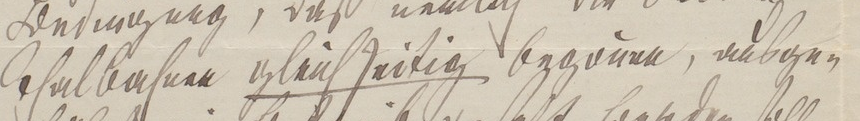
Thalbahnen gleichzeitig begonnen, ausge-
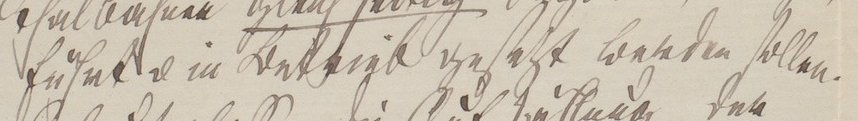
führt & in Betrieb gesetzt werden sollen.
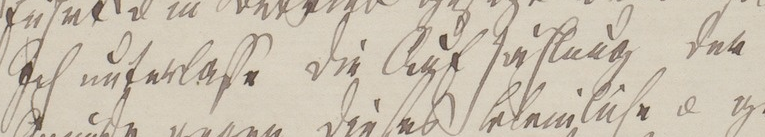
Ich unterlasse die Aufzählung der
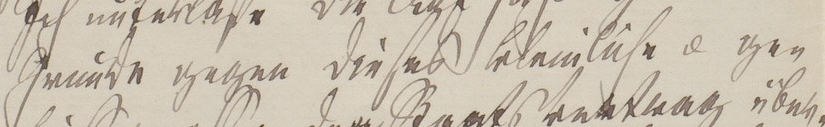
Gründe gegen dieses kleinliche & ge-
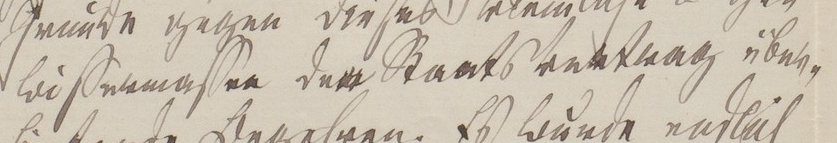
wissermassen den Staatsvertrag über-
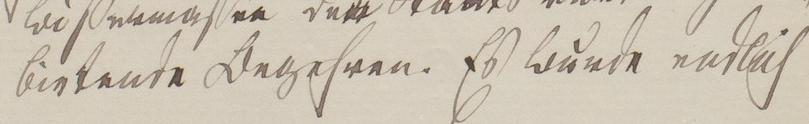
bietende Begehren. Es wurde endlich
